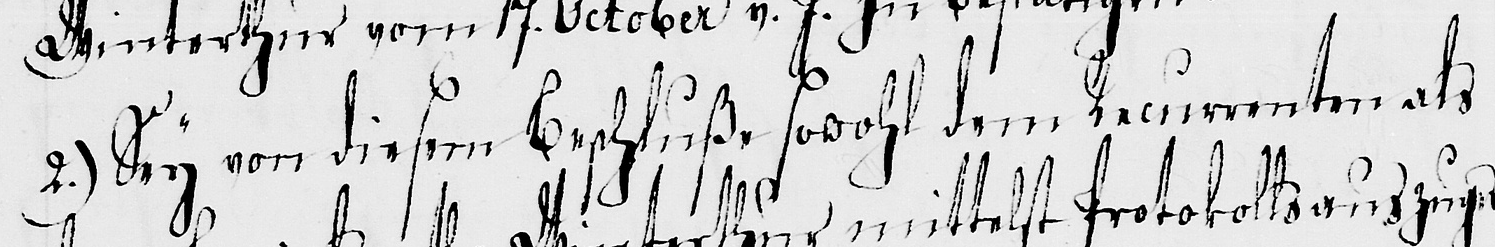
2.) Sey von diesem Beschluße sowohl dem Recurrenten als
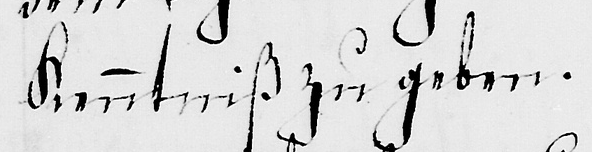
Kenntniß gegeben.
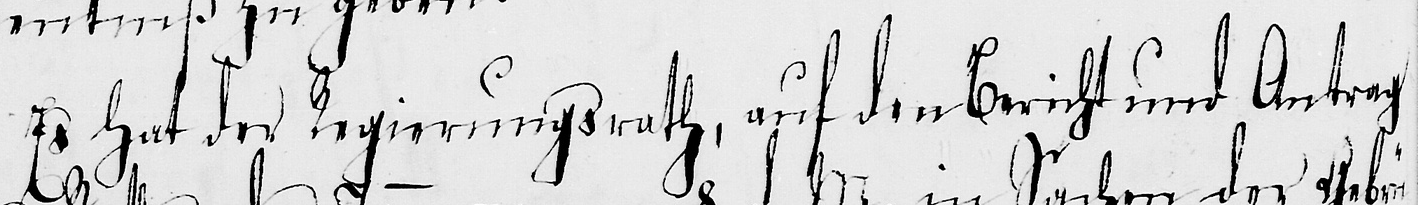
Es hat der Regierungsrath, auf den Bericht und Antrag
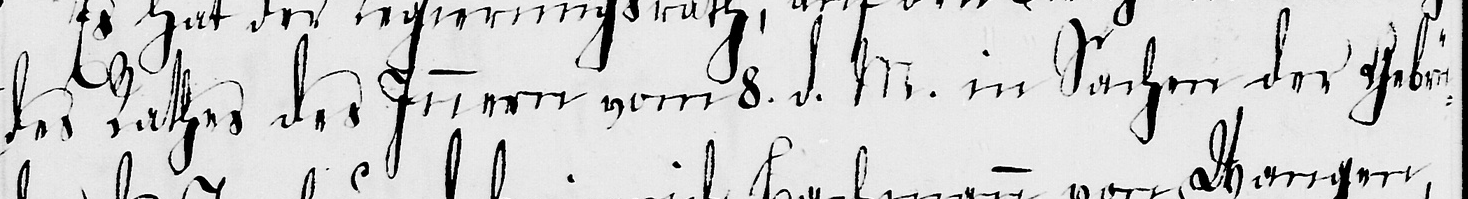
des Rathes des Innern vom 8. d. M. in Sachen der Gebr¬
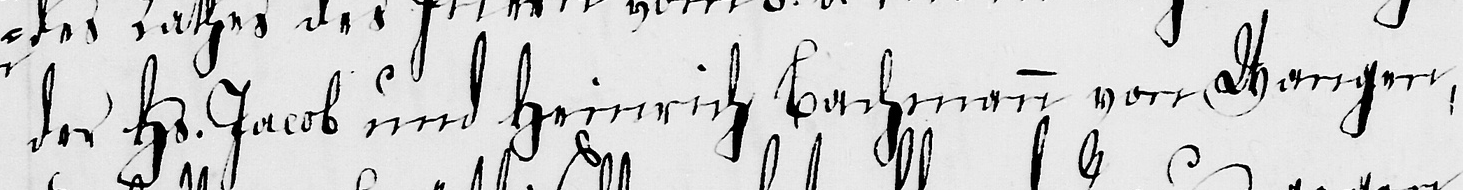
üder Hs. Jacob und Heinrich Bachmann von Wangen,
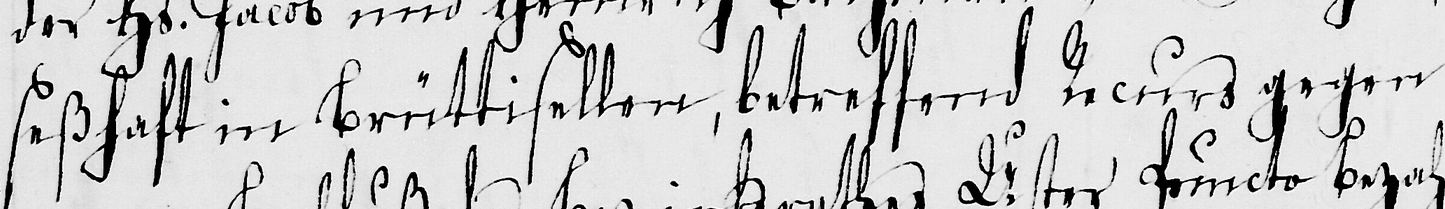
seßhaft in Brüttisellen, betreffend Recurs gegen
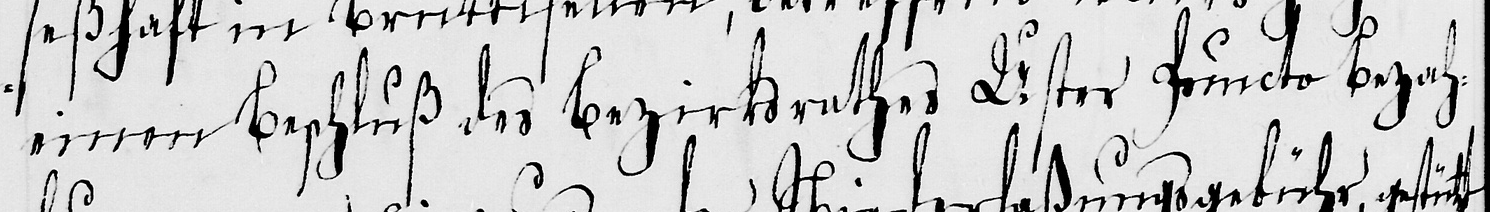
einen Beschluß des Bezirksrathes Uster Puncto Bezah¬
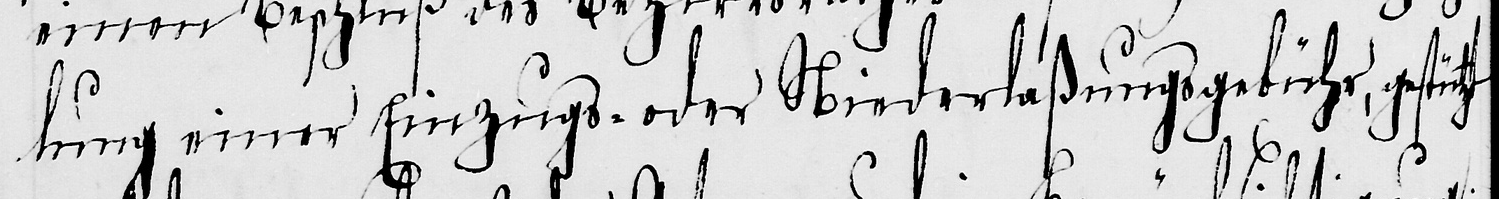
lung einer Einzugs- oder Niederlaßungsgebühr, gest¬
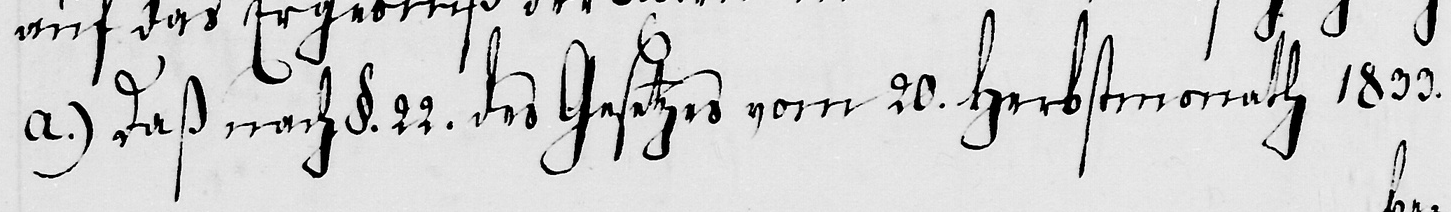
a.) Daß nach §. 22. des Gesetzes vom 20. Herbstmonath 1833.
